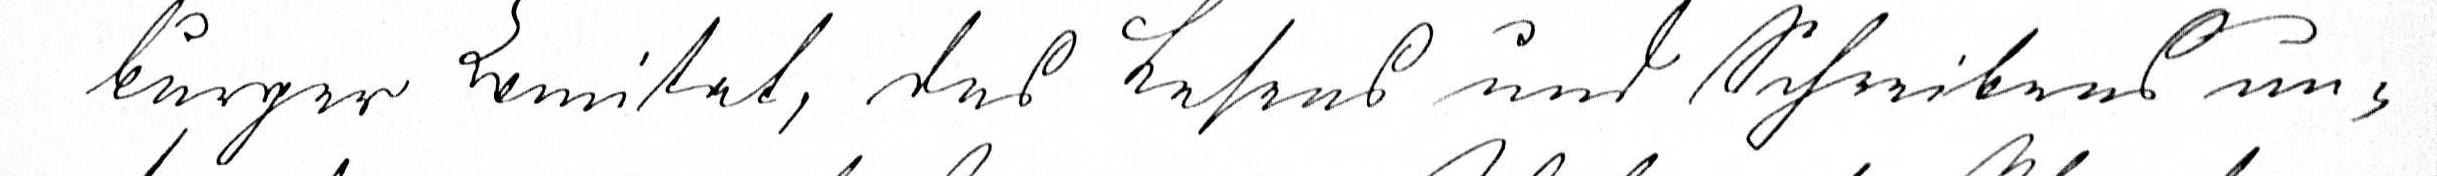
burger Comitet, das Lesens und Schreibens un¬
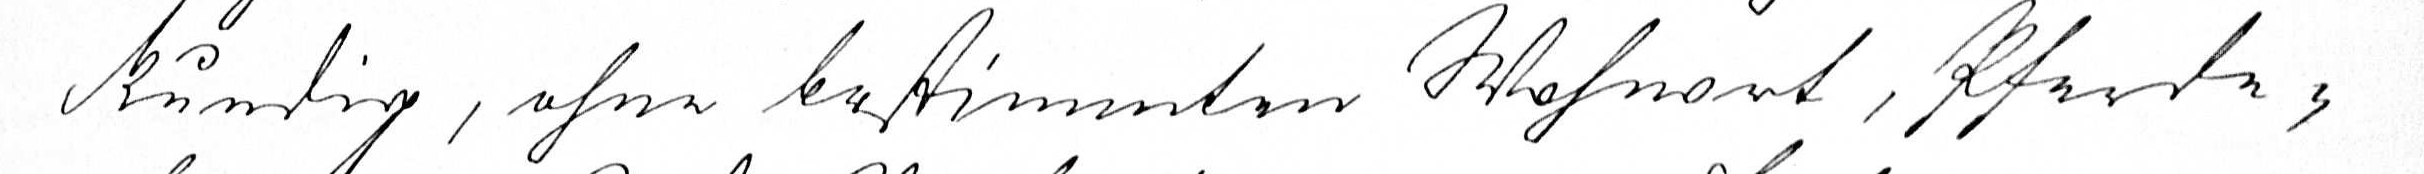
kündig, ohne bestimmten Wohnort, Pferde¬
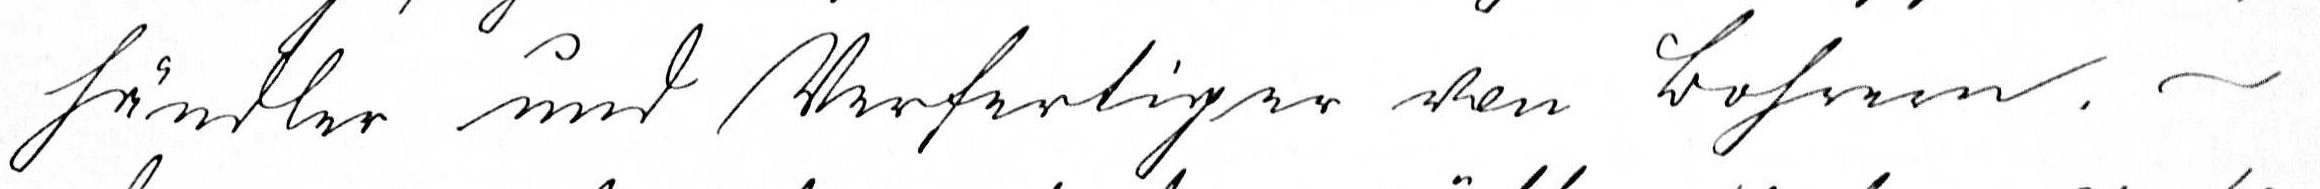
händler und Verfertiger von Bohren.
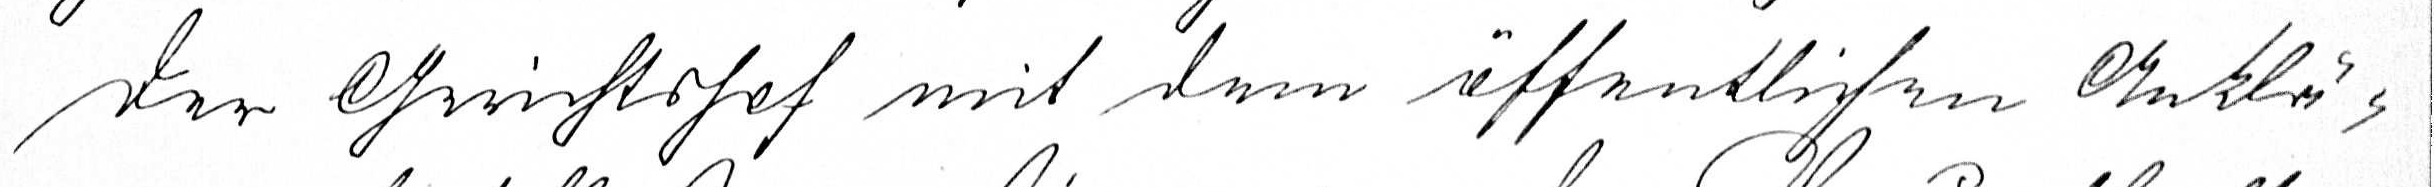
Der Gerichtshof mit dem öffentlichen Anklä¬
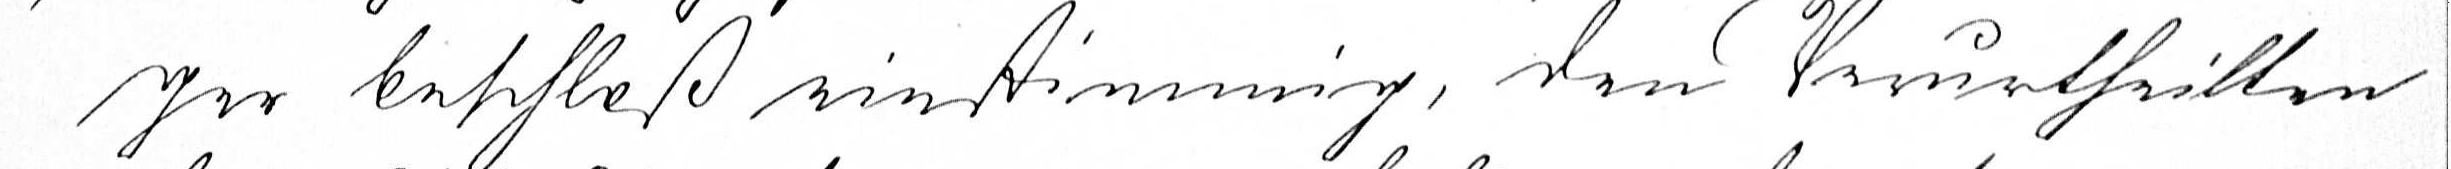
ger beschloß einstimmig, den Verurtheilten
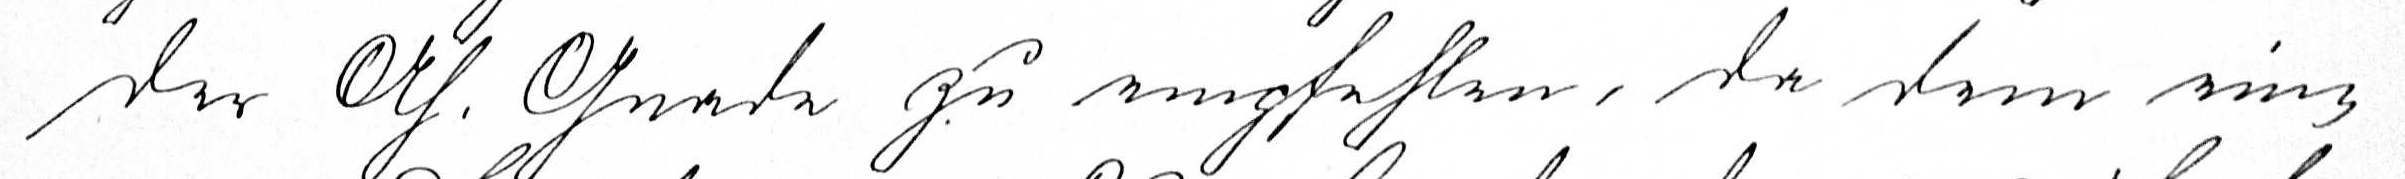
der Ah. Gnade zu empfehlen, da dem ein¬
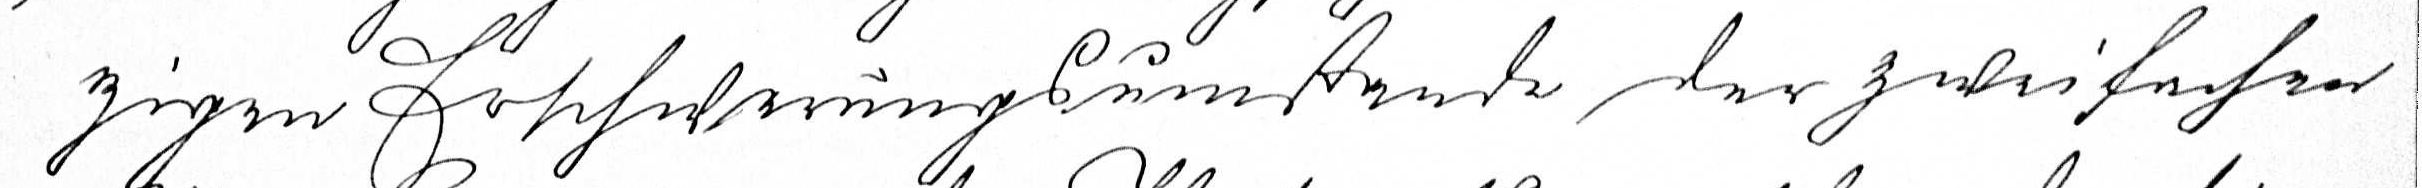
zigen Erschwerungsumstande der zweifacher
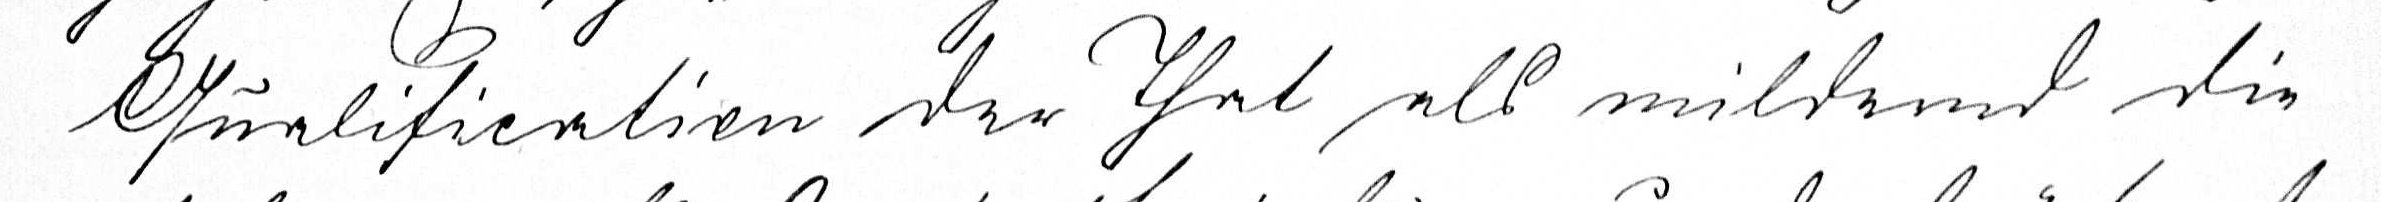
Qualification der That als mildernd die
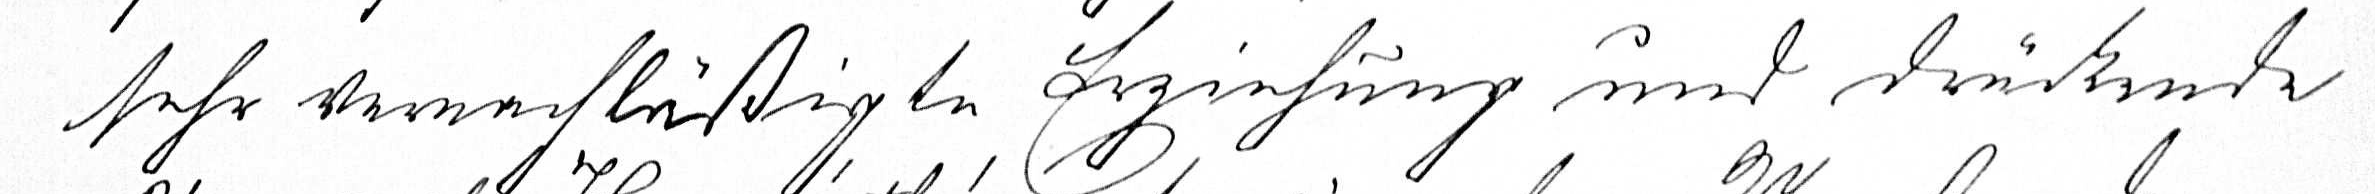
sehr vernachläßigte Erziehung und drückende
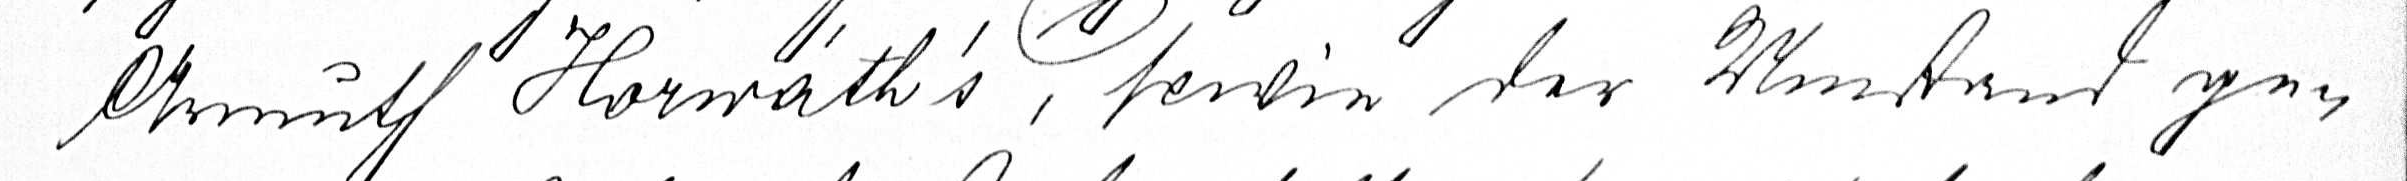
Armuth Horwárth’s, sowie der Umstand ge¬
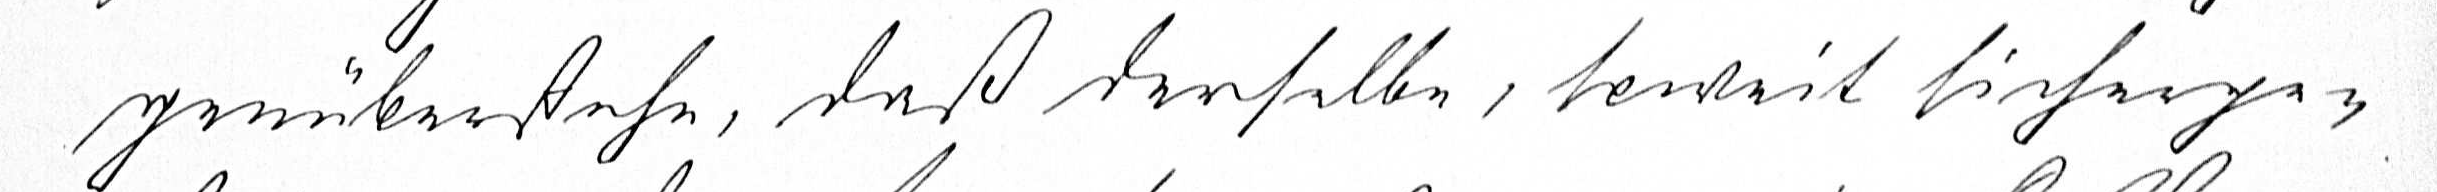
genüberstehe, daß derselbe, soweit sicherge¬
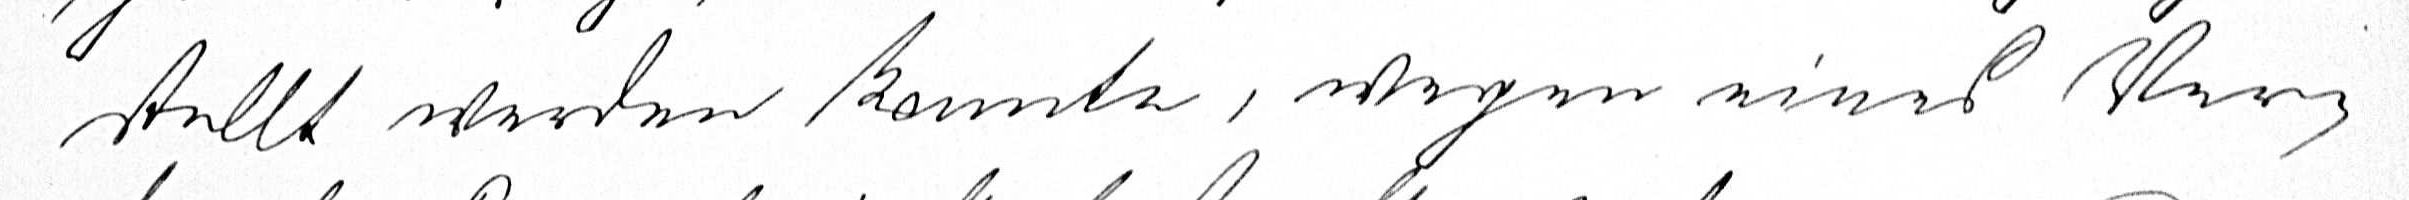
stellt werden konnte, wegen eines Ver¬
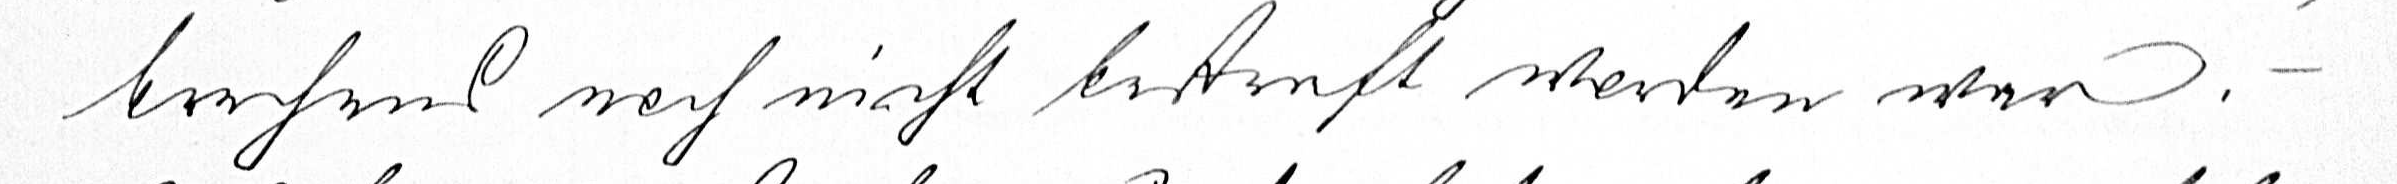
brechens noch nicht bestraft werden war.–
